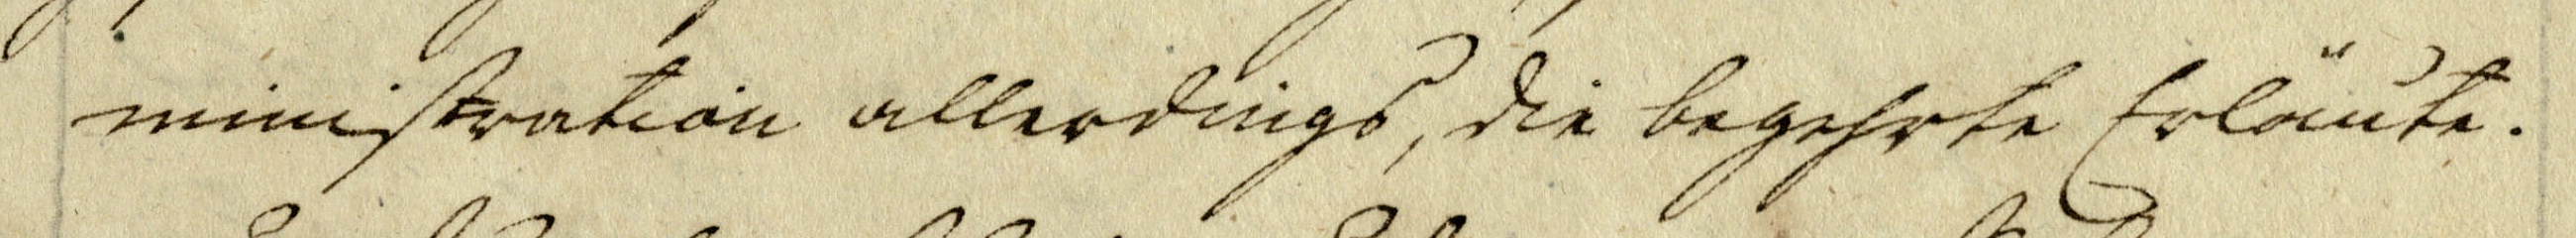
ministration allerdings, die begehrte Erläute¬
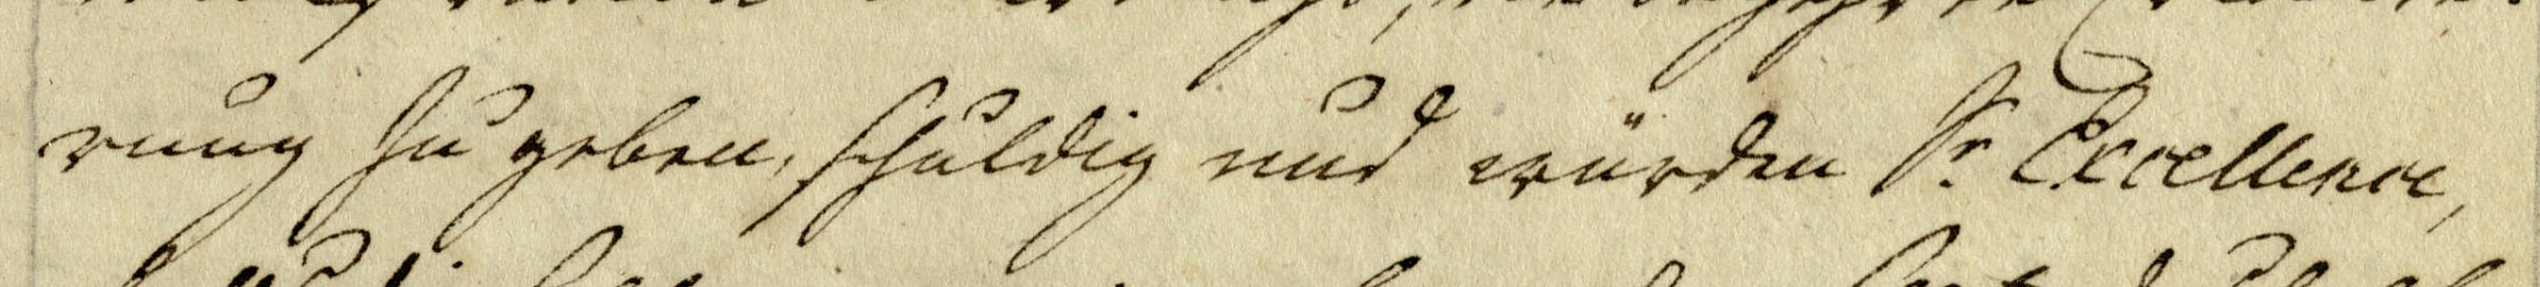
rung zu geben schuldig und würden Sr Excellence,
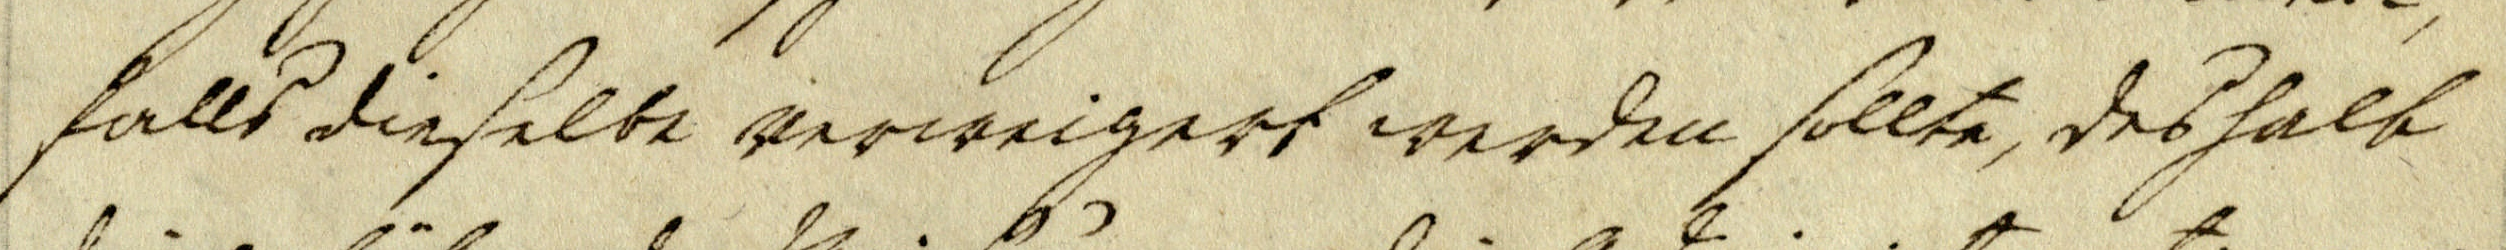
falls dieselbe verweigert werden sollte, deshalb
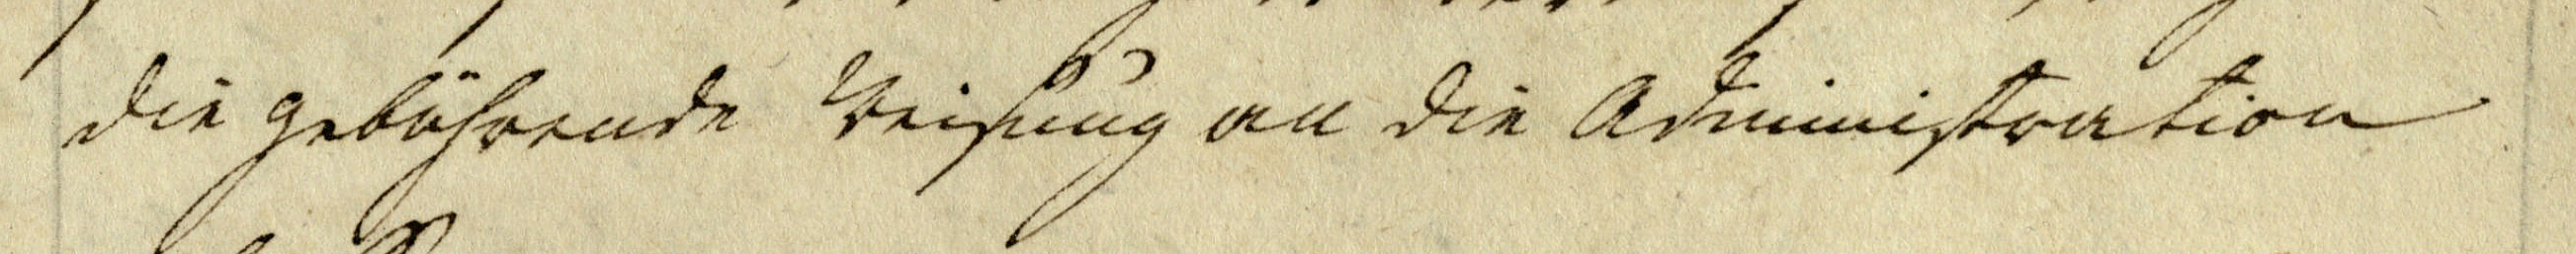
die gebührende Weisung an die Administration
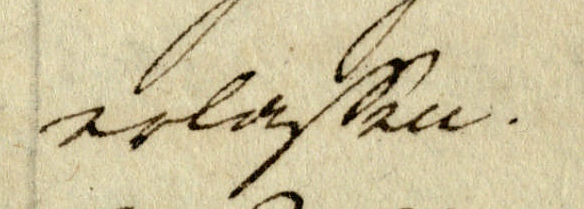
erlassen.
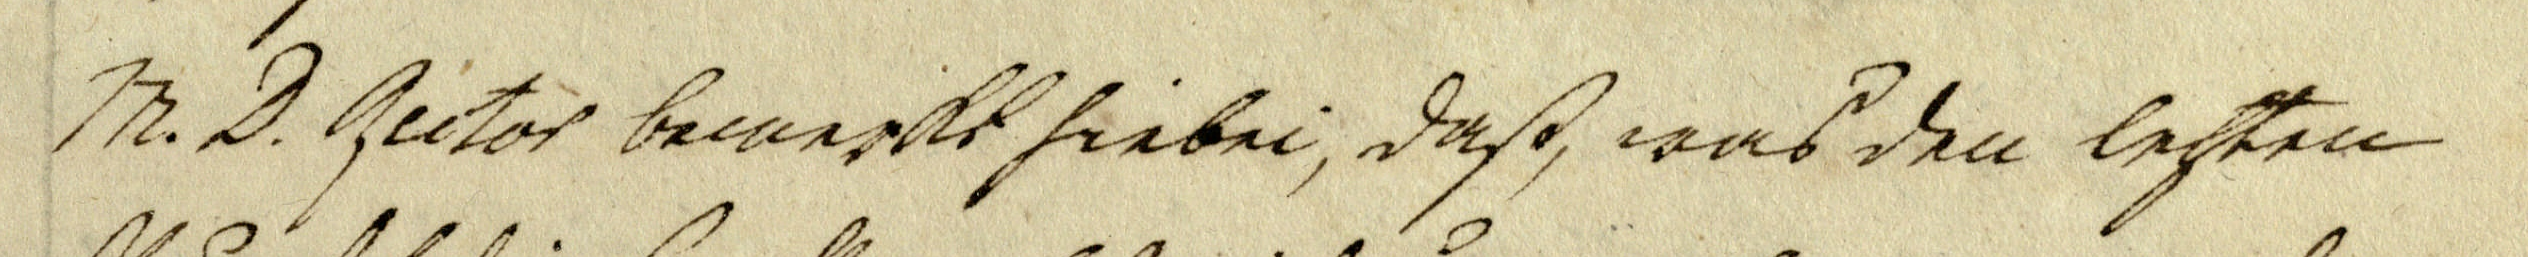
M. D. Rector bemerkt hiebei, daß, was den letzten
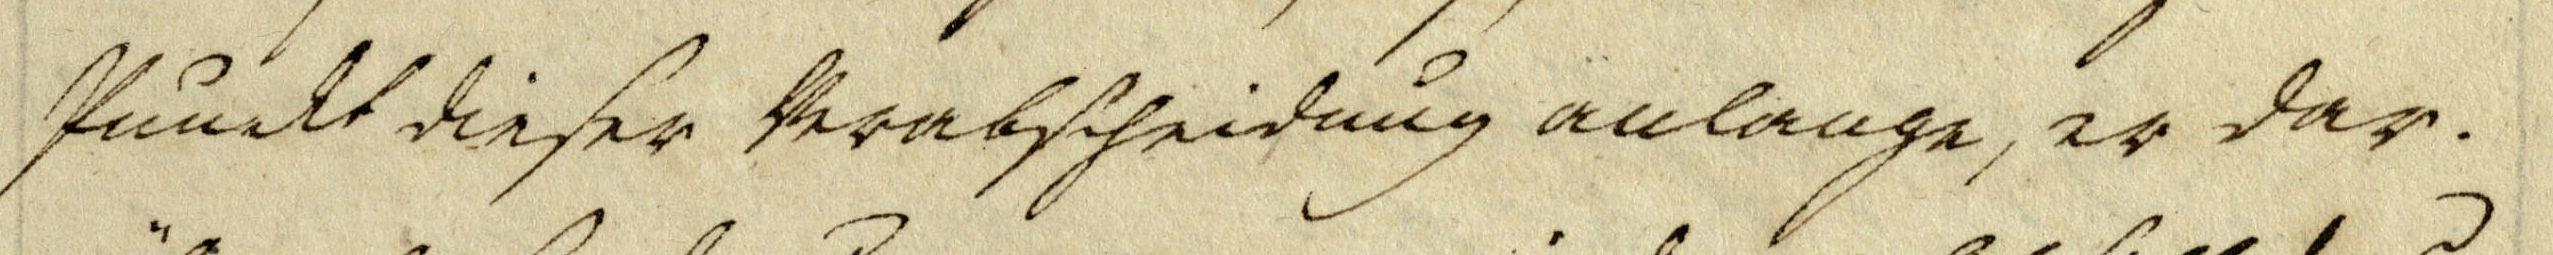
Punckt dieser Verabscheidung anlange, er dar¬
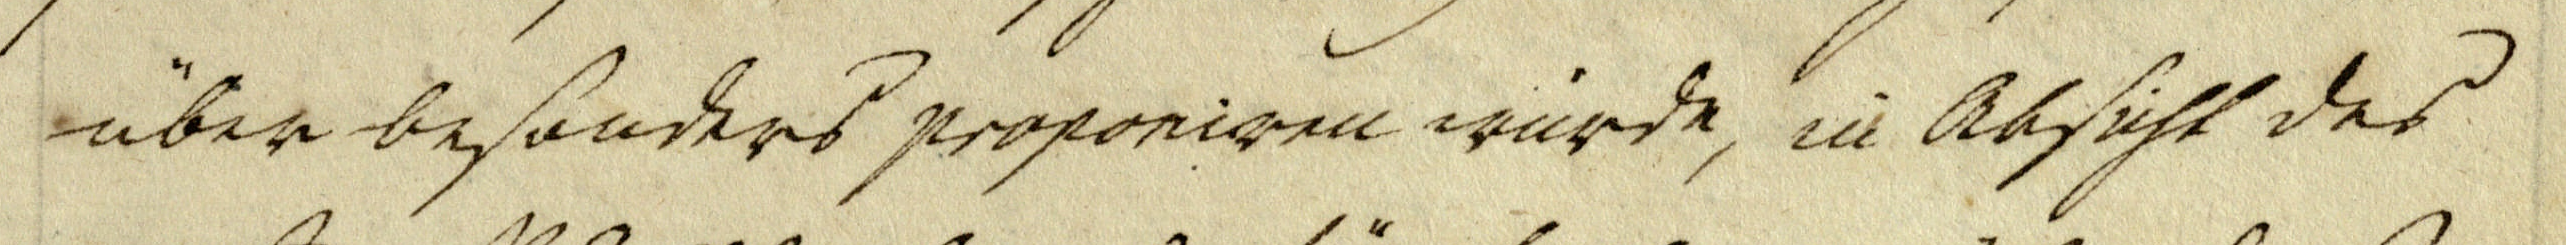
über besonders proponiren würde, in Absicht des
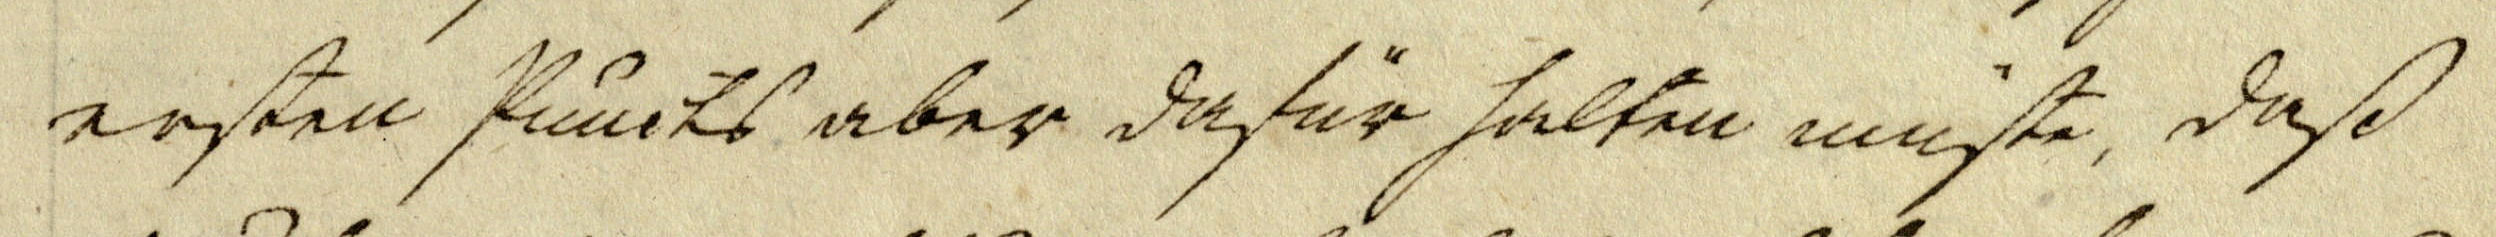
ersten Puncts aber dafür halten müßte, daß
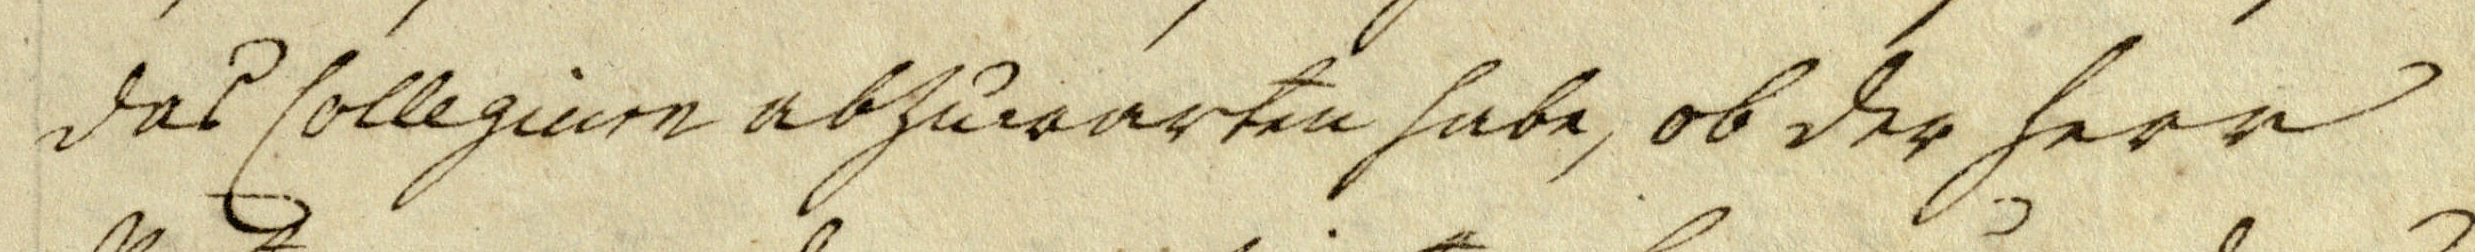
das Collegium abzuwarten habe, ob der Herr
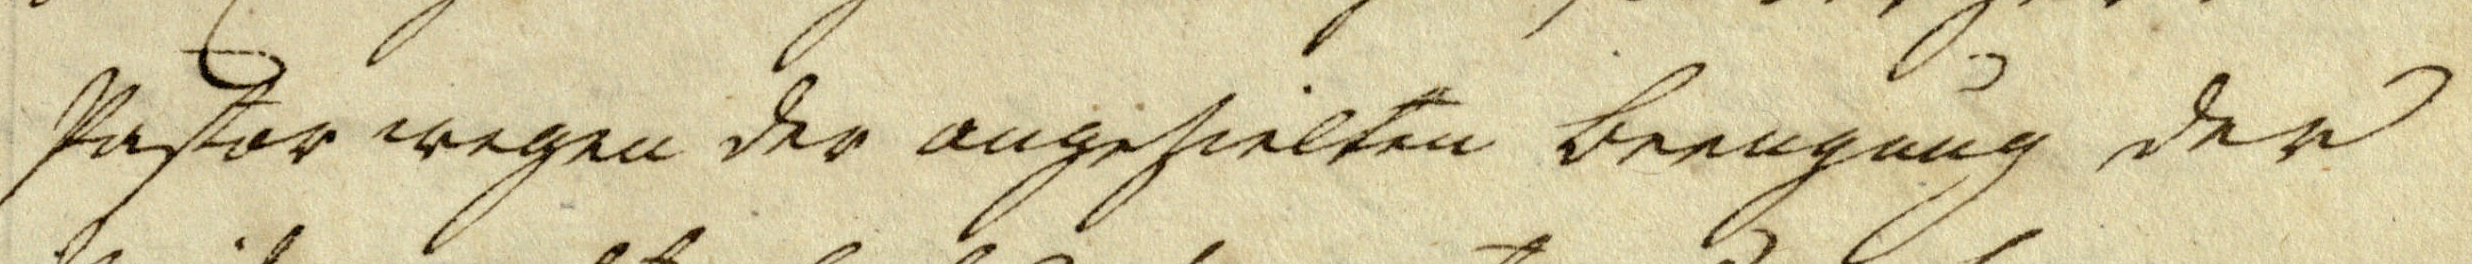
Pastor wegen der angezielten Beengung der
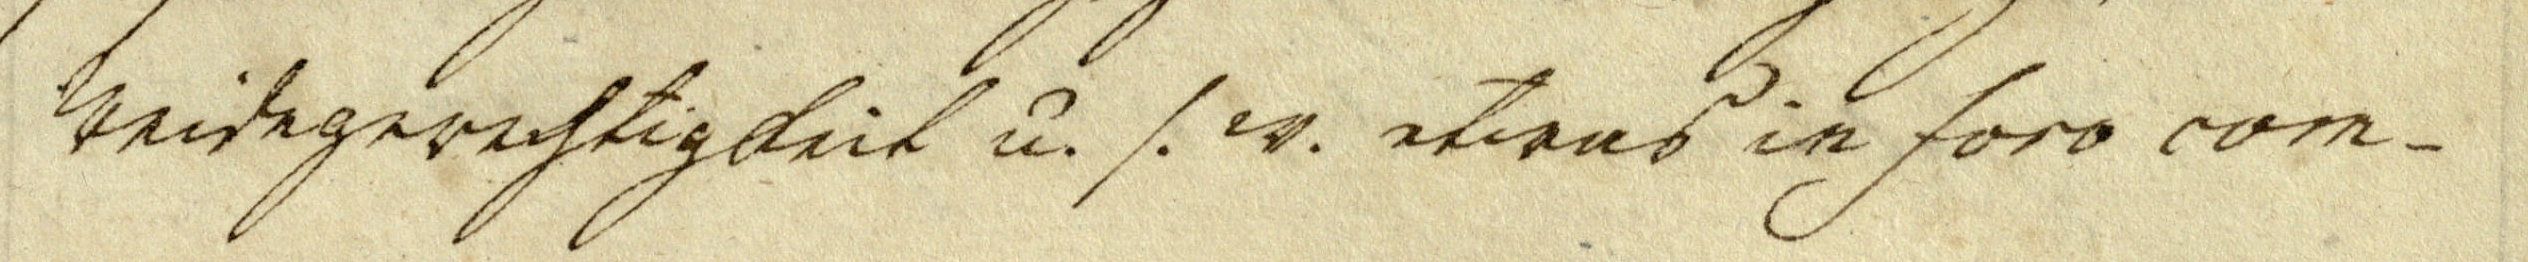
Weidegerechtigkeit u. s. w. etwas in foro com¬
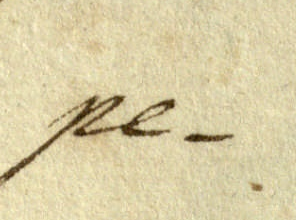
pe¬
